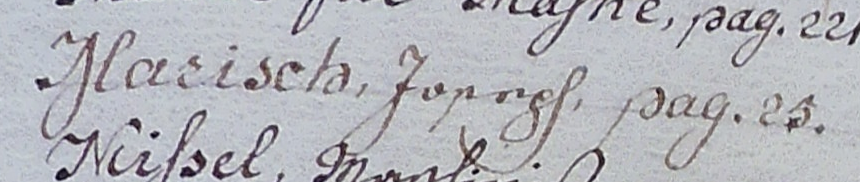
Marisch, Joseph, pag 25.
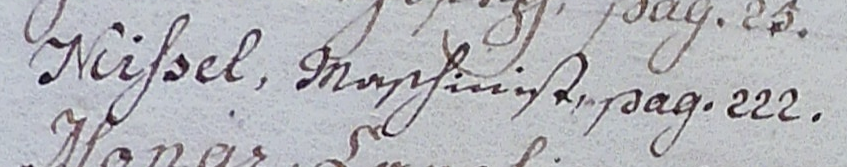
Missl, Maschinist, pag. 222.
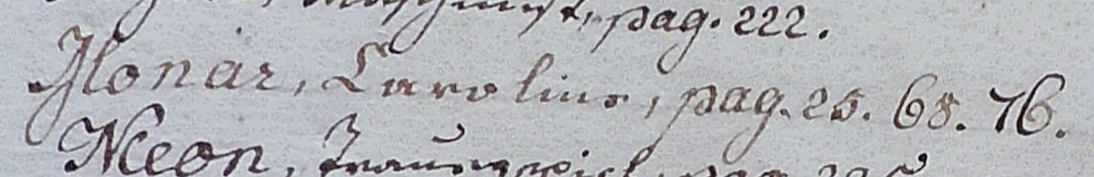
Monar, Caroline, pag. 25. 68. 76.
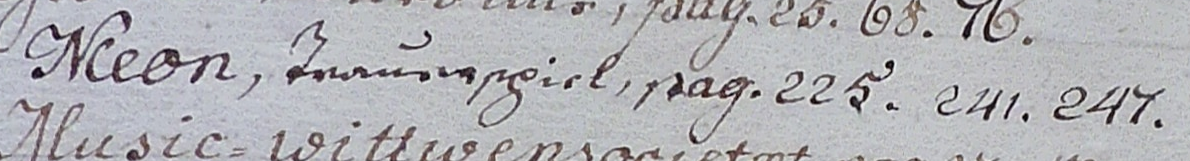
Meon, Trauerspiel, pag. 225. 241. 247.
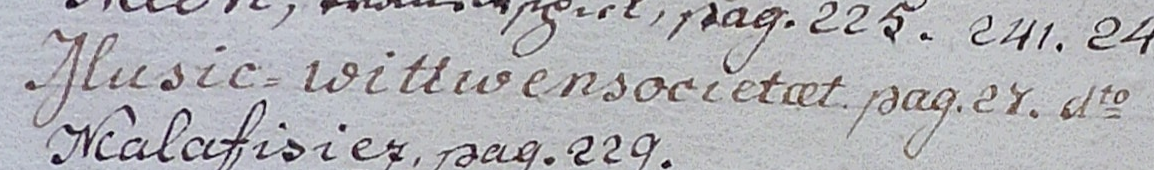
Music=wittwensocietæt. pag. 27.dto͇
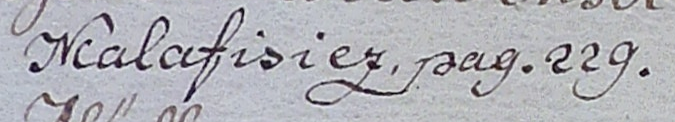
Malafisiez, pag. 229
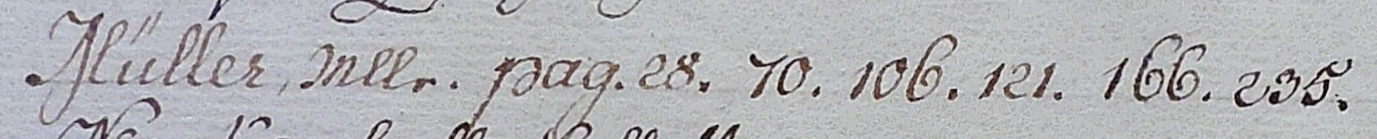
Müller, Mlle. pag. 28. 70. 106. 121. 166. 235.
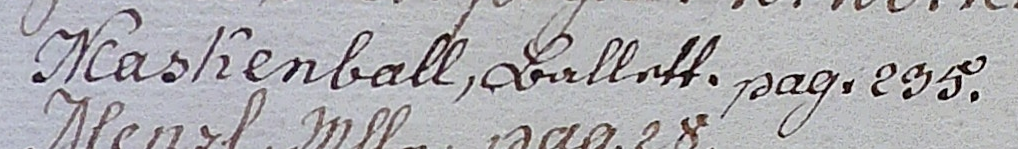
Maskenball, Ballett. pag. 235.
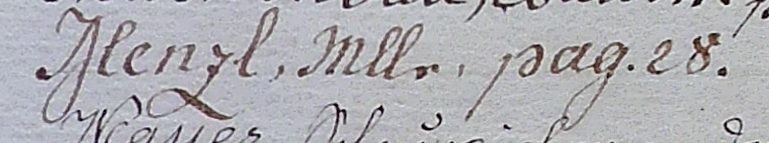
Menzl, Mlle, pag. 28.
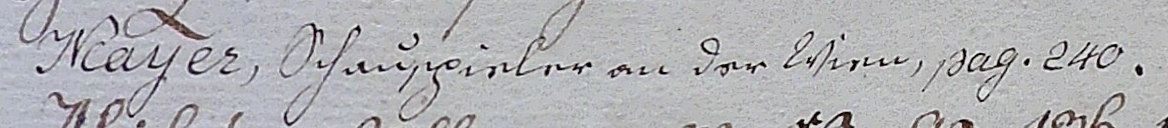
Mayer, Schauspieler an der Wien, pag. 240.
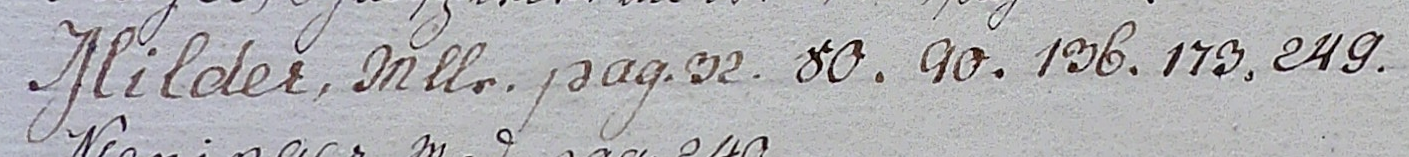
Milder, Mlle. pag. 32. 80. 90. 136. 173. 249.
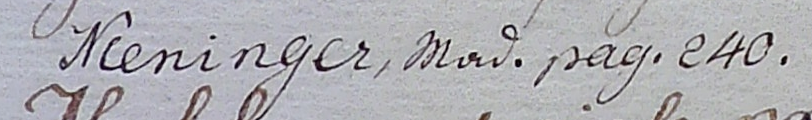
Meninger, Mad. pag. 240.
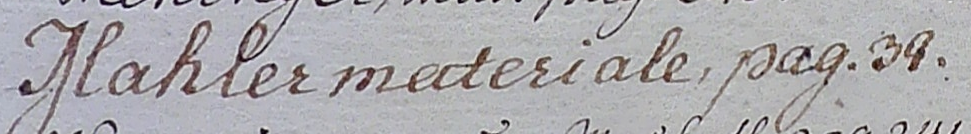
Mahlermateriale, pag 39.
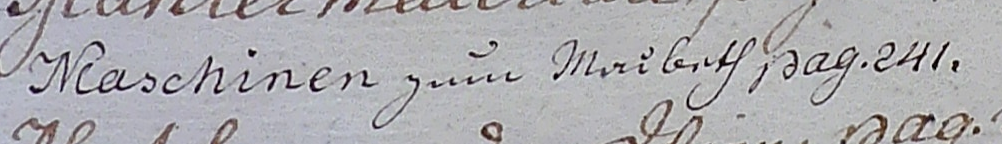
Maschinen zum Macbeth pag. 241.
